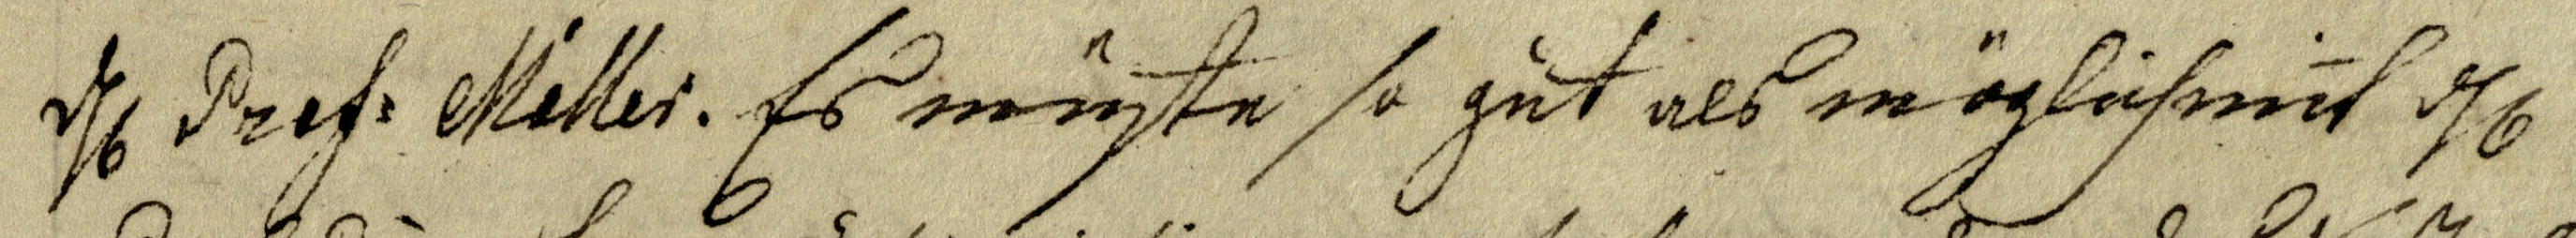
dh Prof. Möller. Es müßte so gut als möglich mit dh
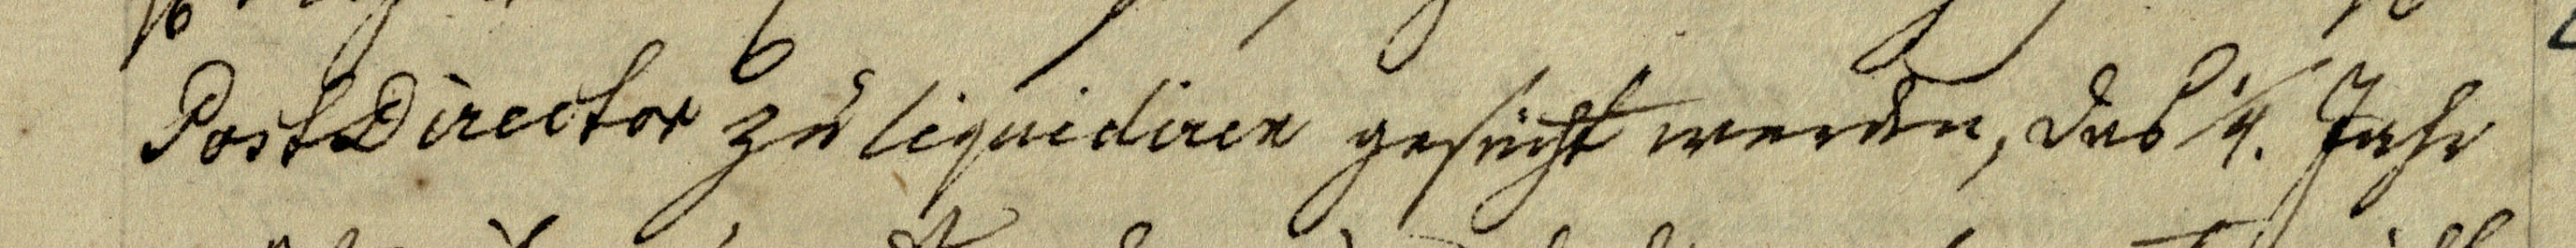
Post Director zu liquidiren gesucht werden, das ¼. Jahr
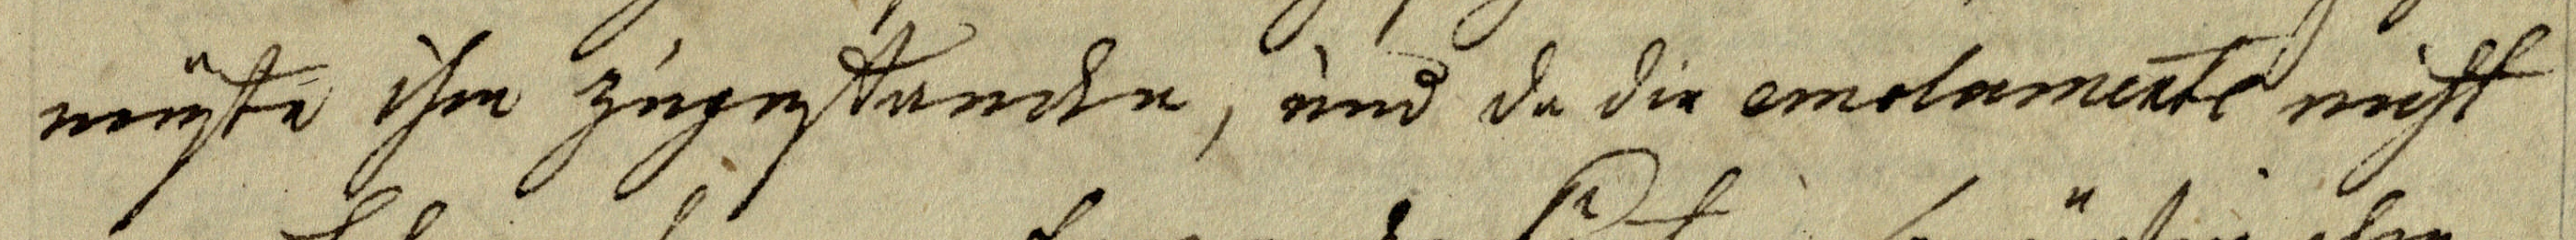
müßte ihm zugestanden, und da die emolumente nicht
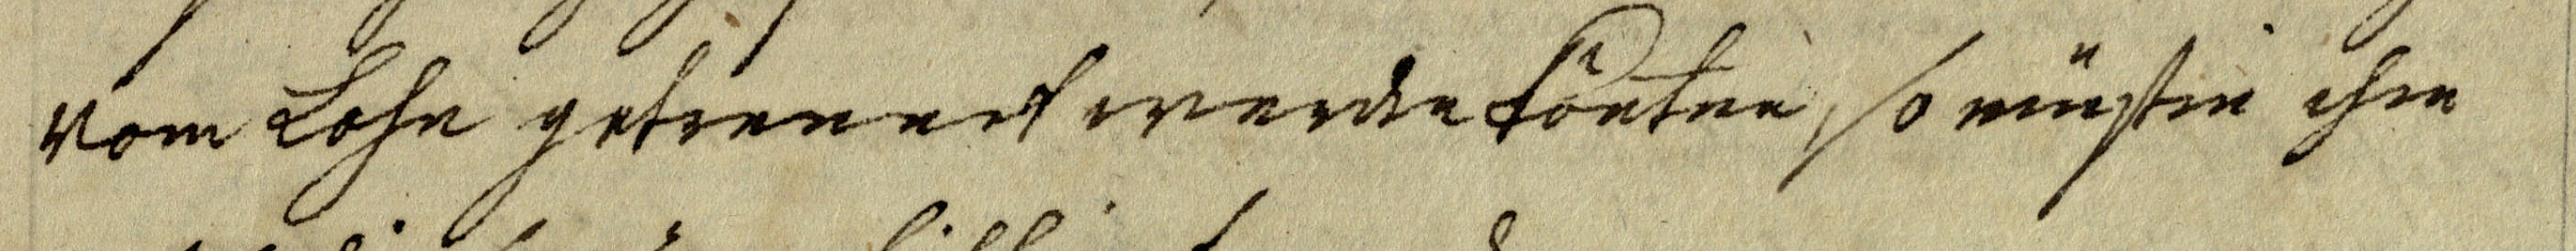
vom Lohn getrennet werden könten, so müßten ihm
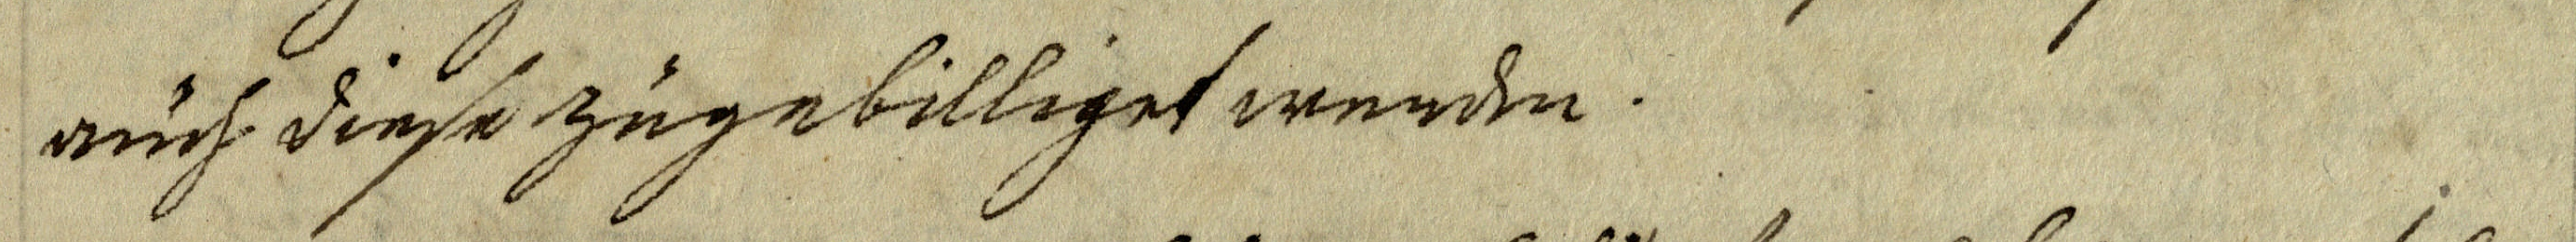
auch diese zugebilliget werden.
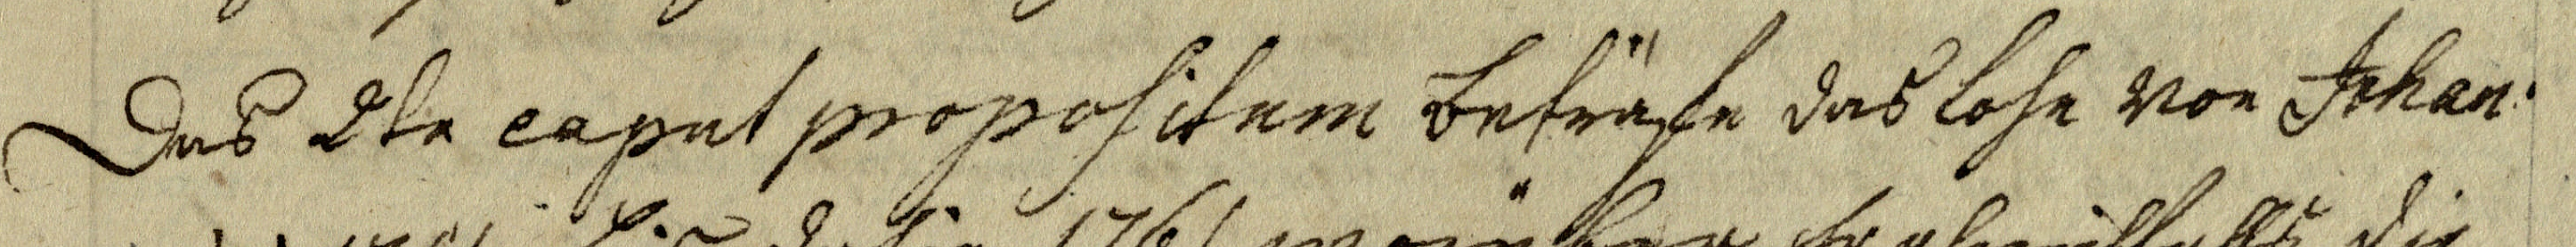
Das 2te caput propositum beträfe das Lohn von Johan¬
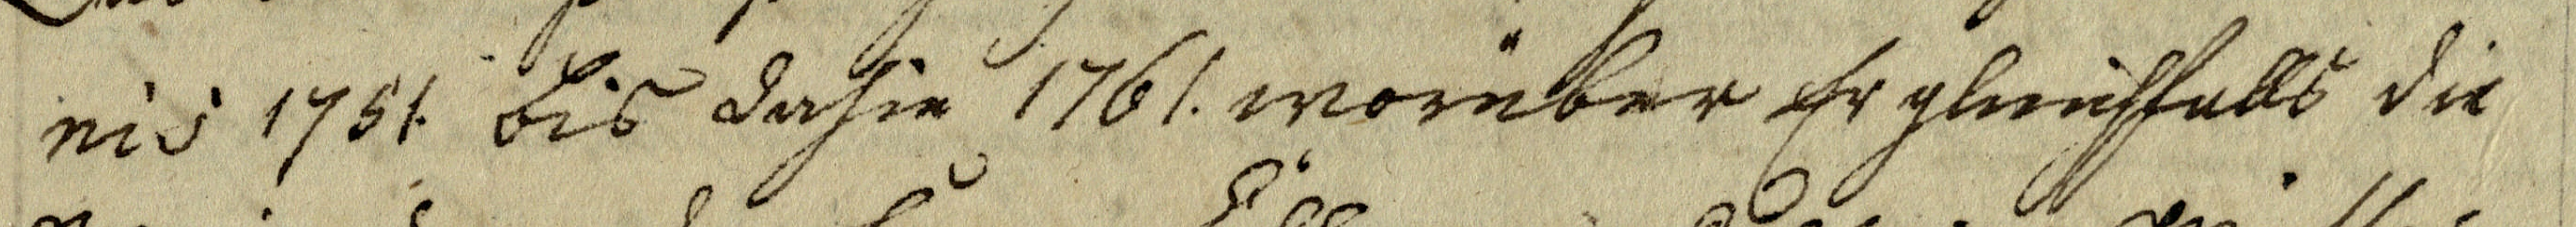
nis 1751. bis dahin 1761. worüber Er gleichfalls die
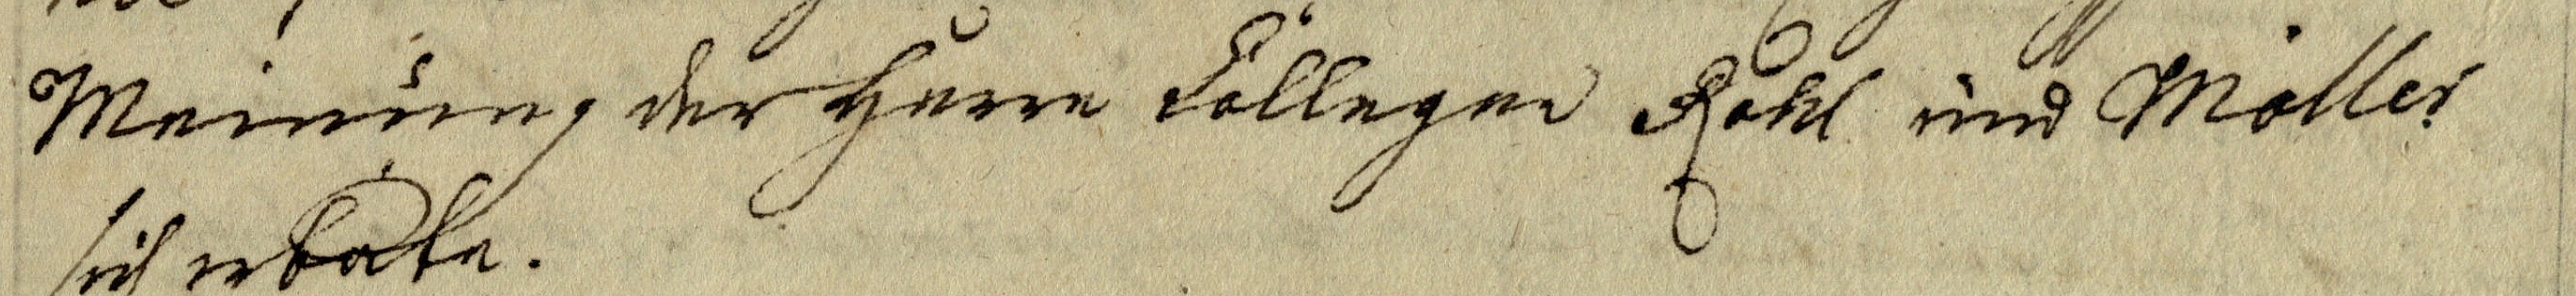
Meinung der Herrn Collegen Röhl und Möller
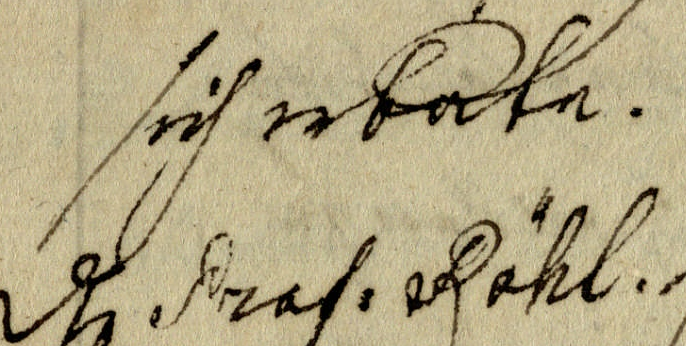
sich erbäte.
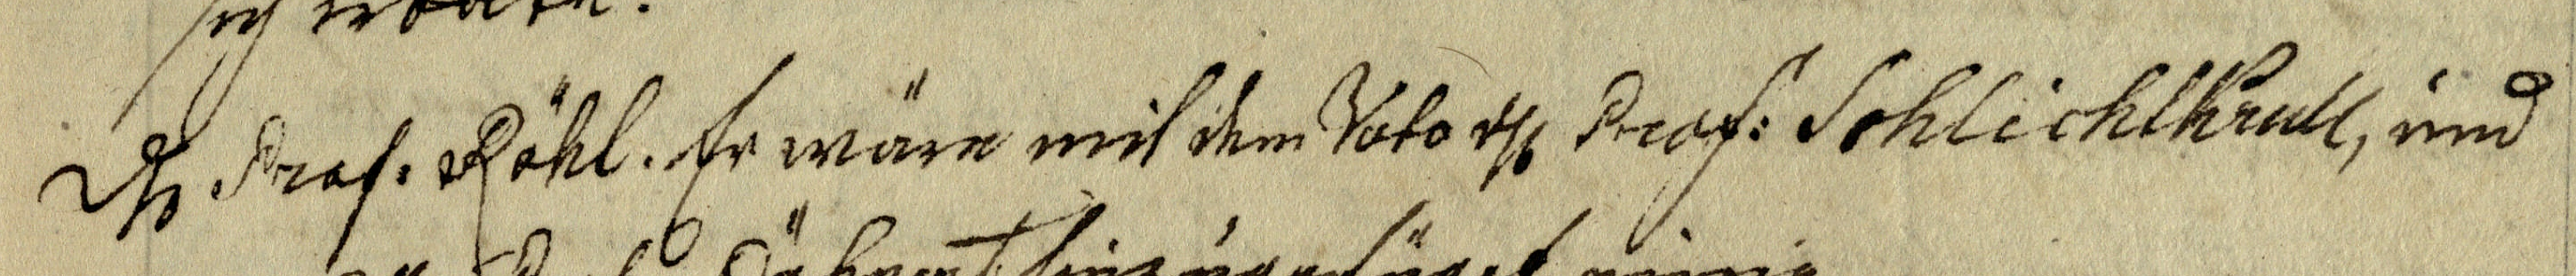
dh Prof. Röhl. Er wäre mit dem Voto dh Prof. Schlichtkrull, und
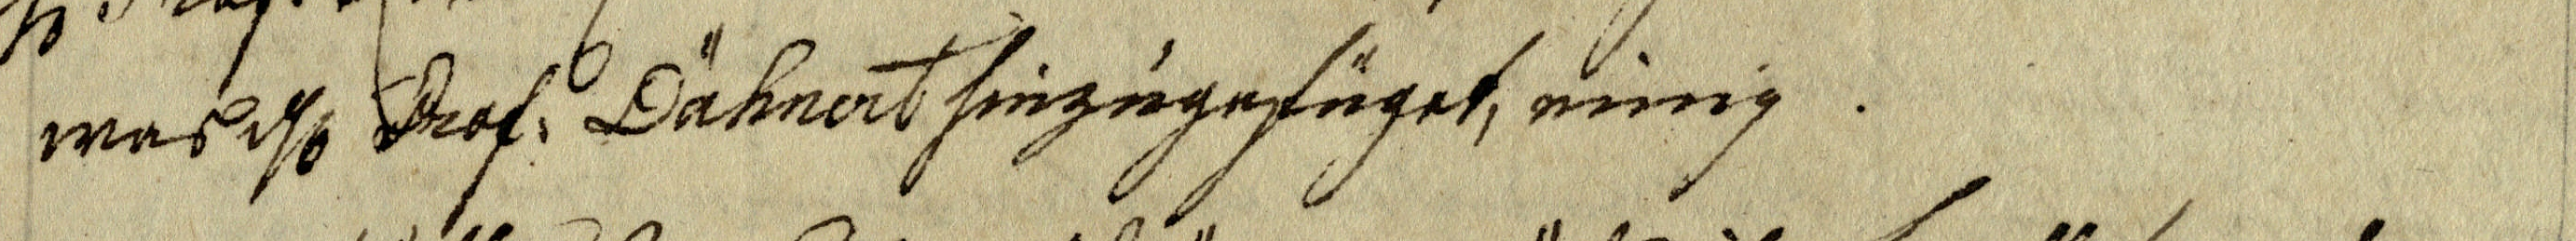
was dh Prof. Dähnert hinzugefüget, einig.
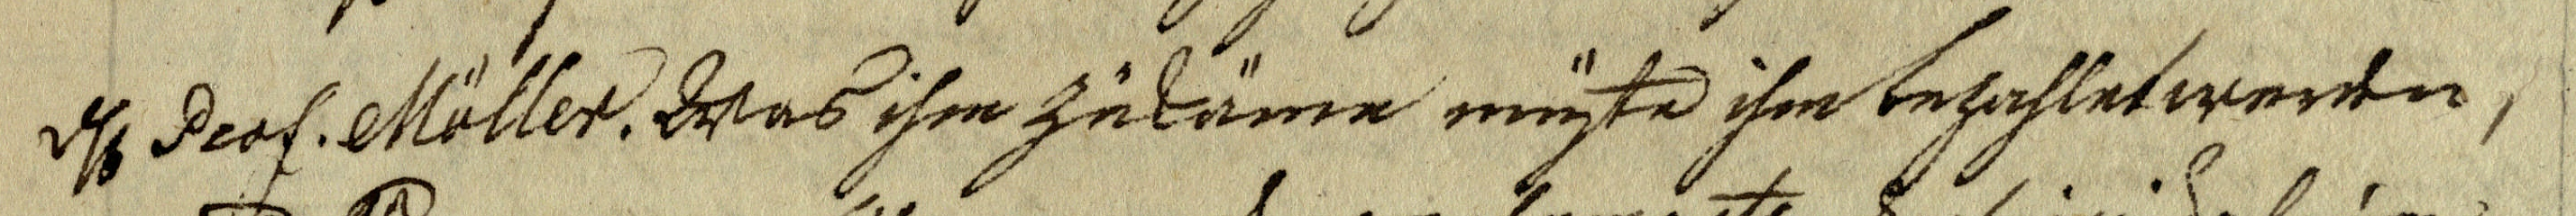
dh Prof. Möller. Was ihm zukäme müßte ihm bezahlet werden,
